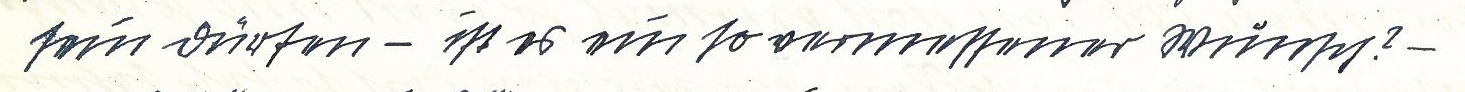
sein dürfen – ist es ein so vermessener Wunsch? –
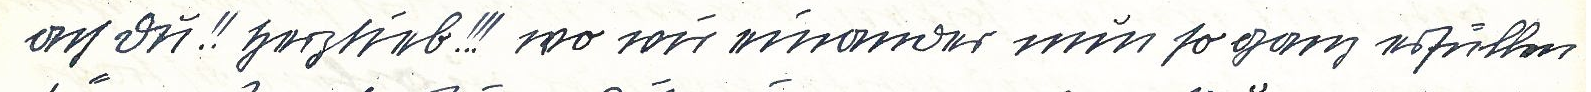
ach Du!! Herzlieb!!! wo wir einander nun so ganz erfüllen
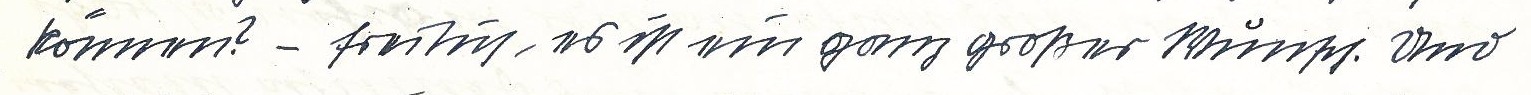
können? – freilich, es ist ein ganz großer Wunsch. Und
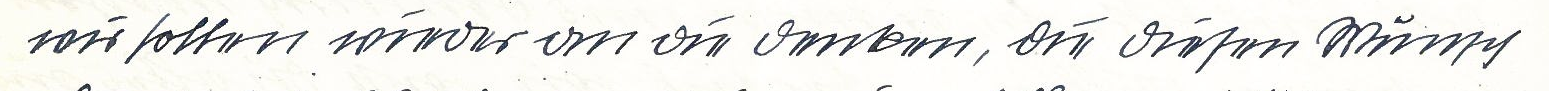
wir sollen wieder an die denken, die diesen Wunsch
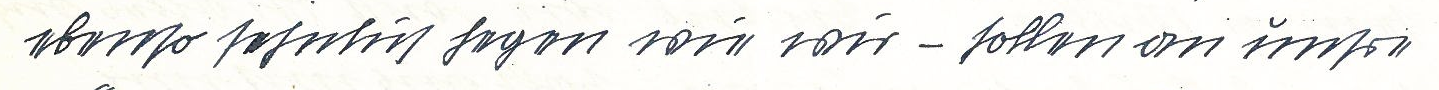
ebenso sehnlich hegen wie wir – sollen an unsre
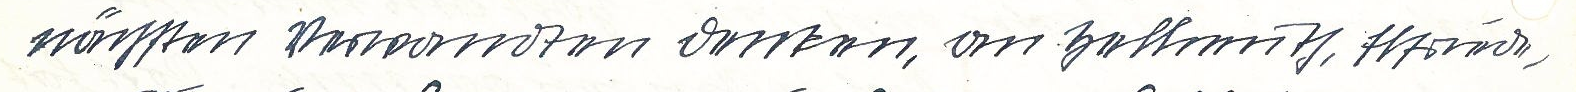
nächsten Verwandten denken, an H., E.,
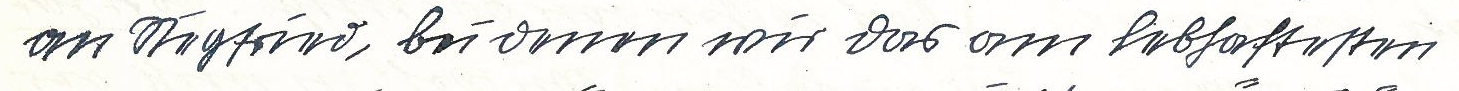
an S., bei denen wir das am lebhaftesten
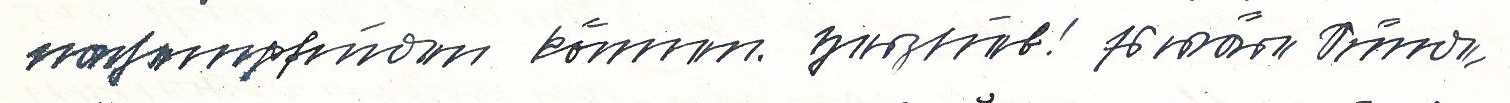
nachempfinden können. Herzlieb! Es wäre Sünde,
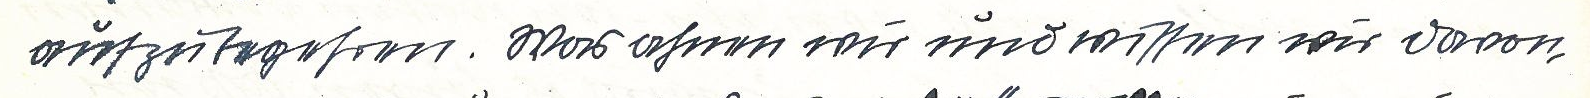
aufzubegehren. Was ahnen wir und wissen wir davon,
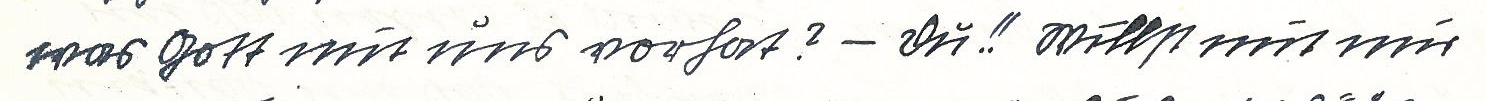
was Gott mit uns vorhat? – Du!! Willst mit mir
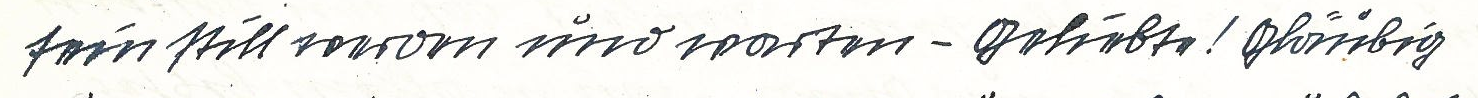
fein still werden und warten – Geliebte! Gläubig
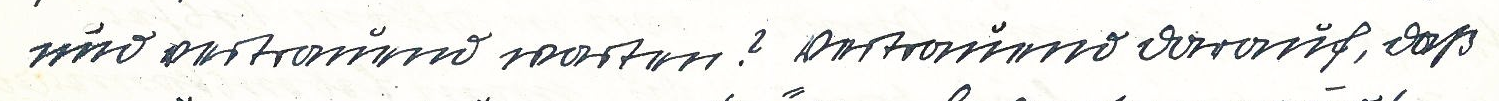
und vertrauend warten? Vertrauend darauf, daß
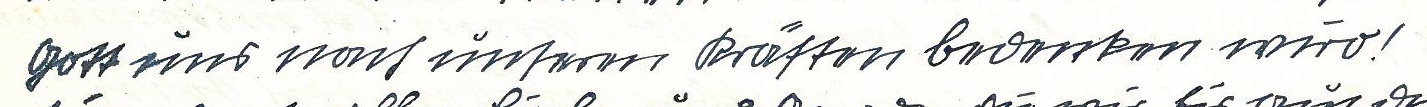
Gott uns nach unseren Kräften bedenken wird!
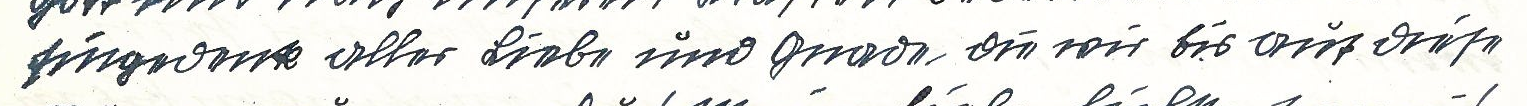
Eingedenk aller Liebe und Gnade, die wir bis auf diese
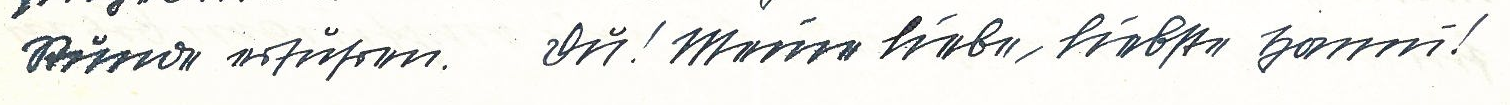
Stunde erfuhren. Du! Meine liebe, liebste !
